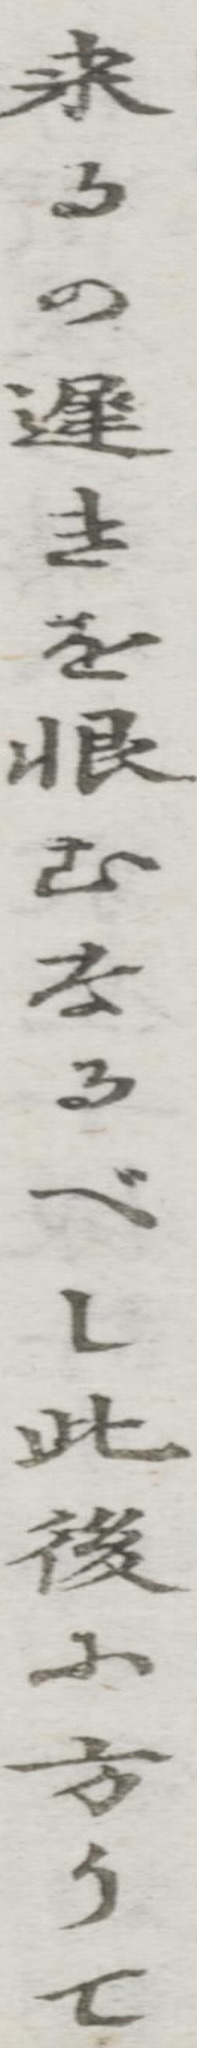来るの遅きを恨むなるべし此後に方りて
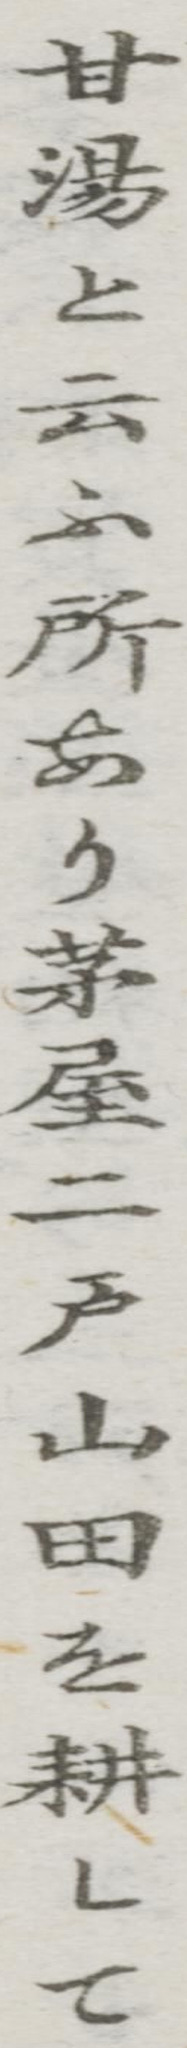甘湯と云ふ所あり茅屋二戸山田を耕して
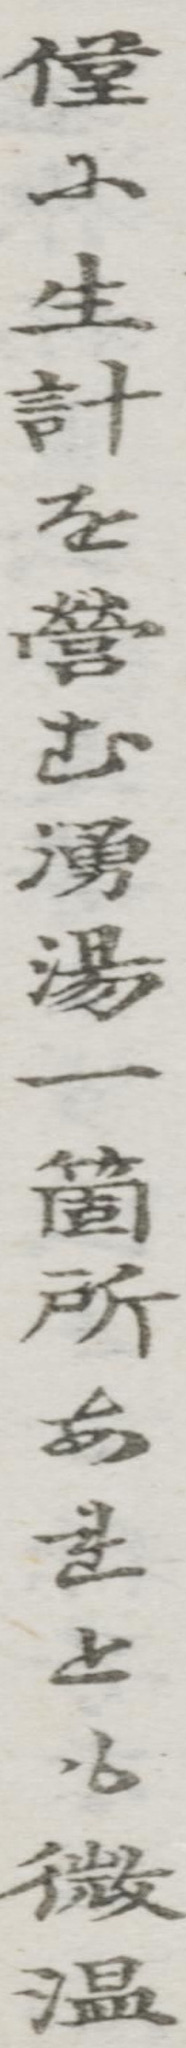僅に生計を営む湧湯一箇所あれとも微温
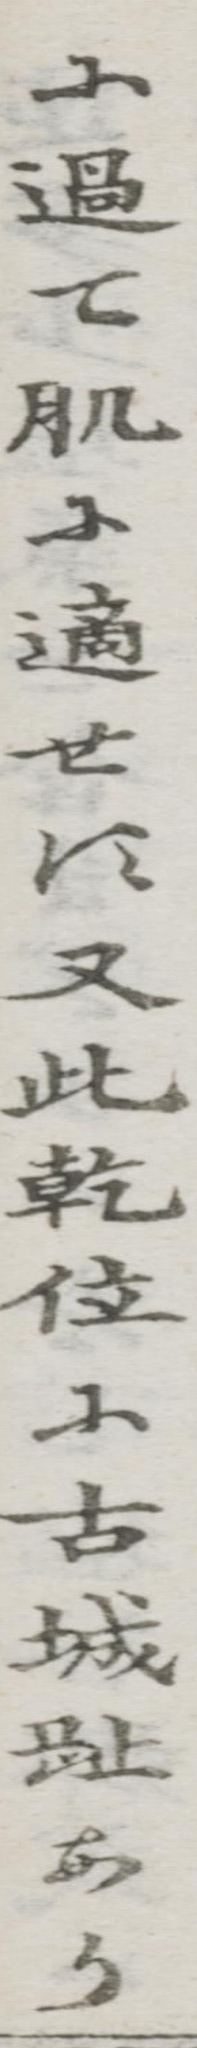に過て肌に適せす又此乾位に古城趾あり
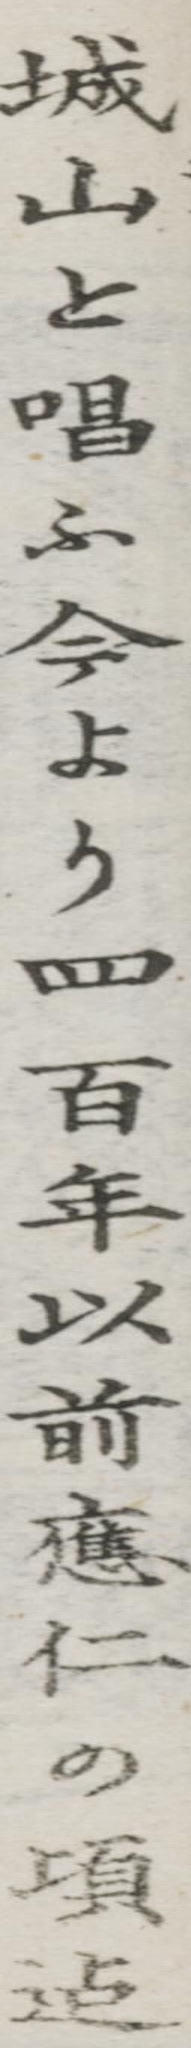城山と唱ふ今より四百年以前応仁の頃迠
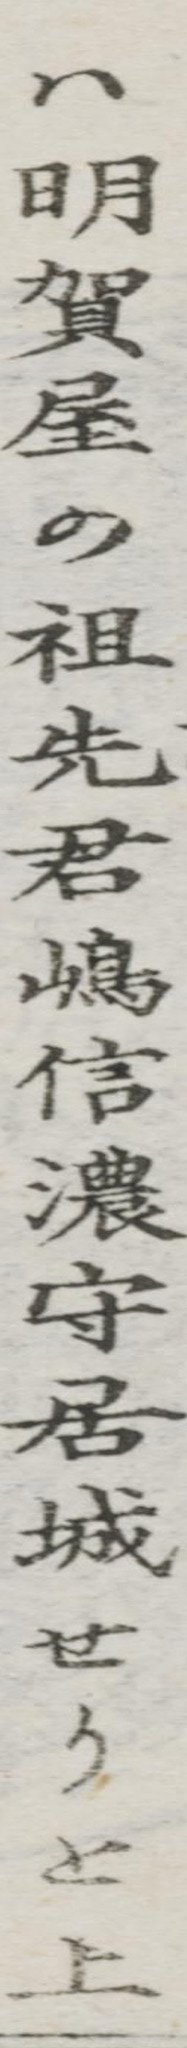は明賀屋の祖先君嶋信濃守居城せりと上
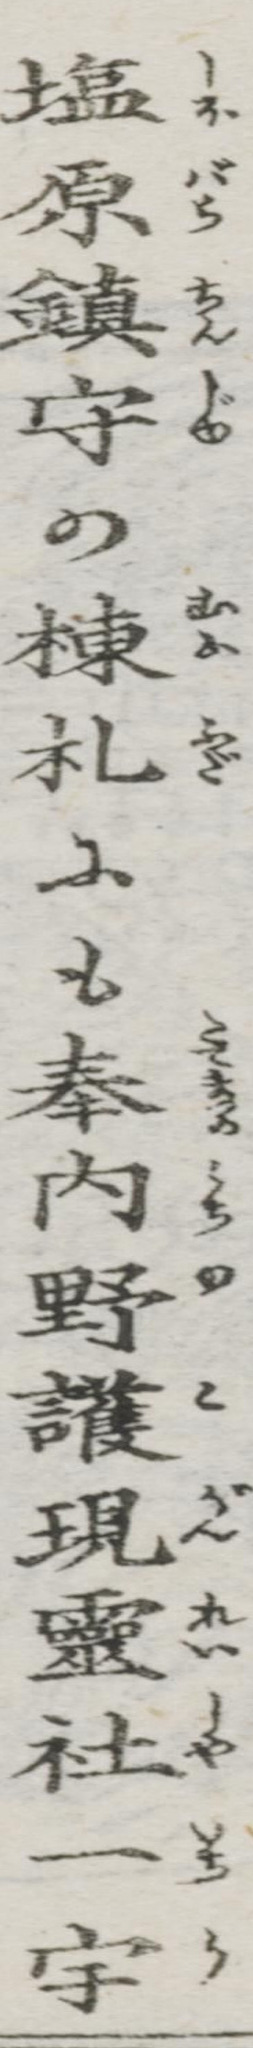塩原鎮守の棟札にも奉内野護現霊社一宇
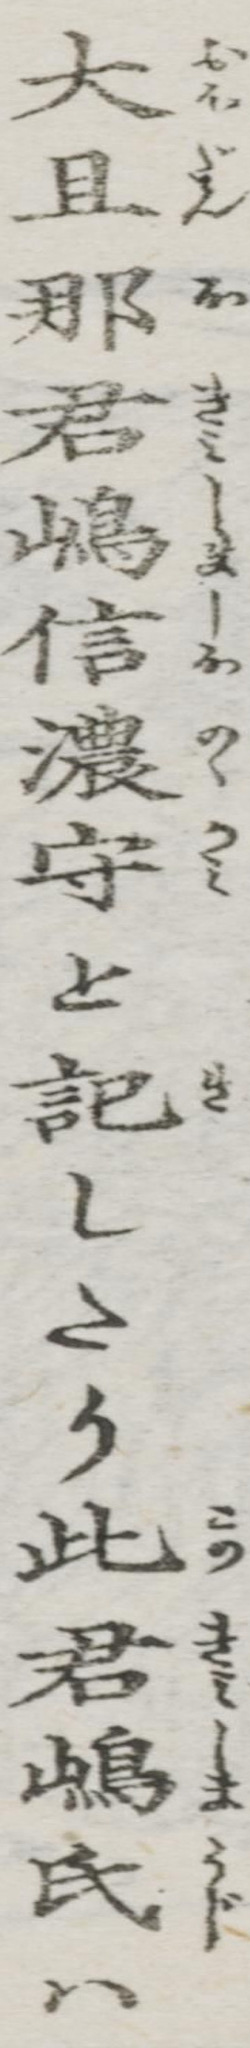大旦那君嶋信濃守と記したり此君嶋氏は
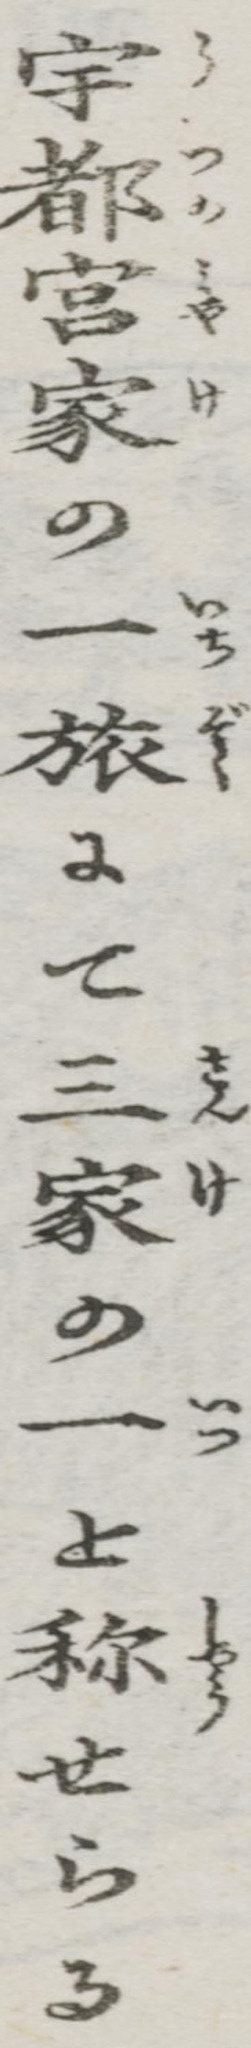宇都宮家の一族にて三家の一と称せらる
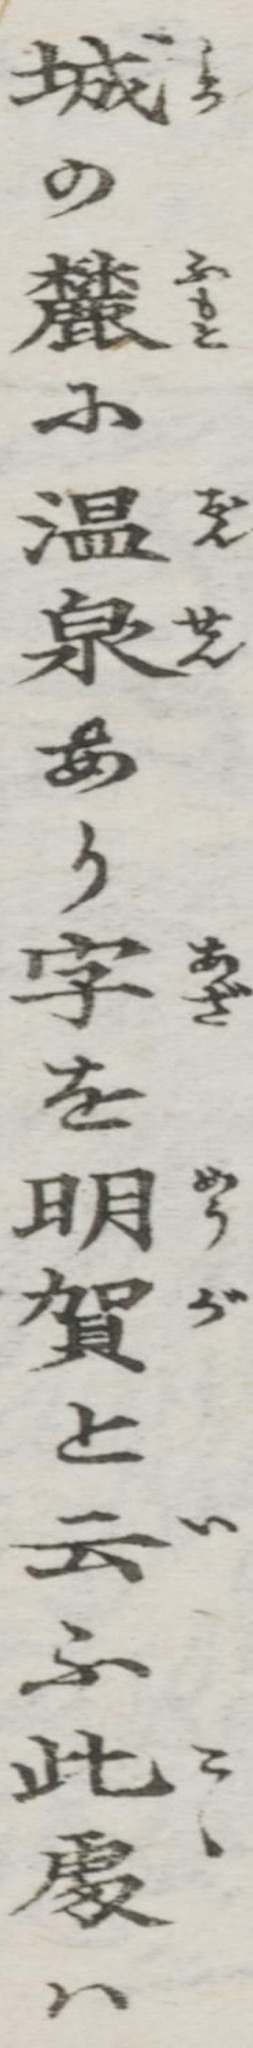城の麓に温泉あり字を明賀と云ふ此處は
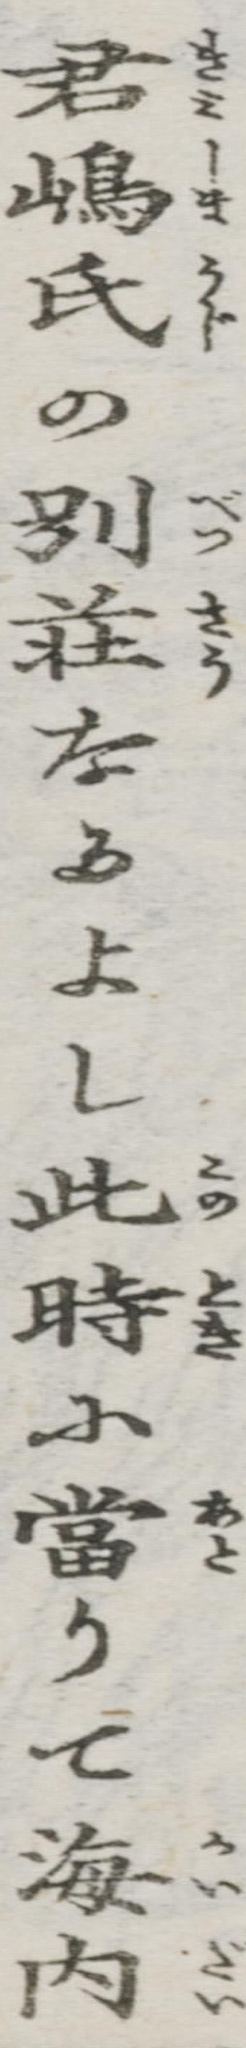君嶋氏の別荘なるよし此時に當りて海内
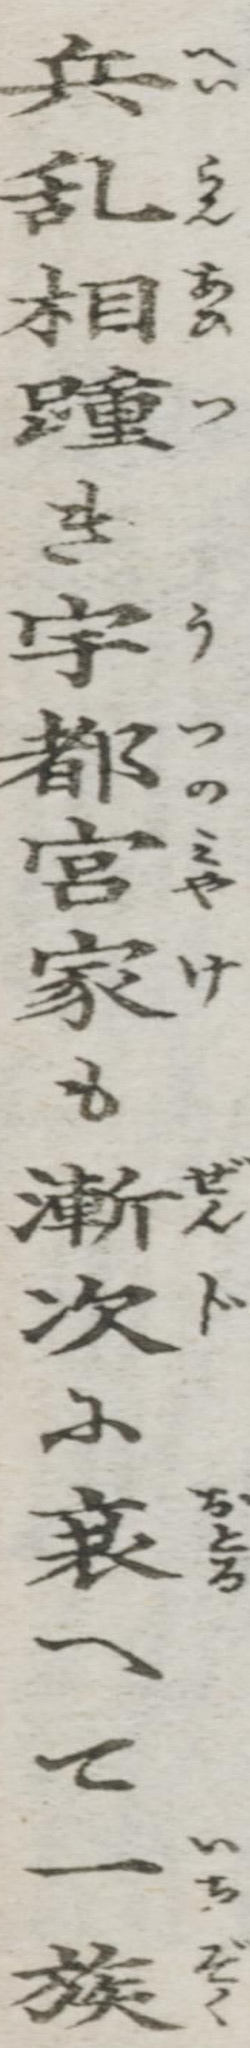兵乱相踵き宇都宮家も漸次に衰へて一族

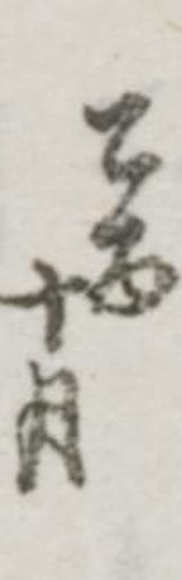乙酉十月
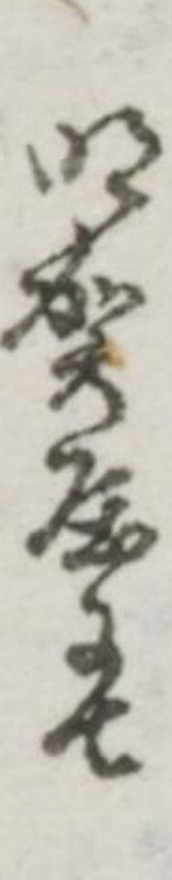明賀屋にて
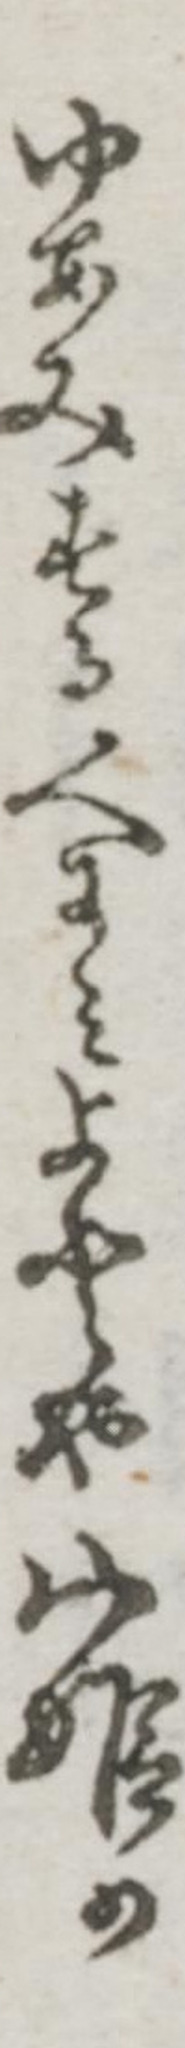ゆあみする人にみよとや山姫の
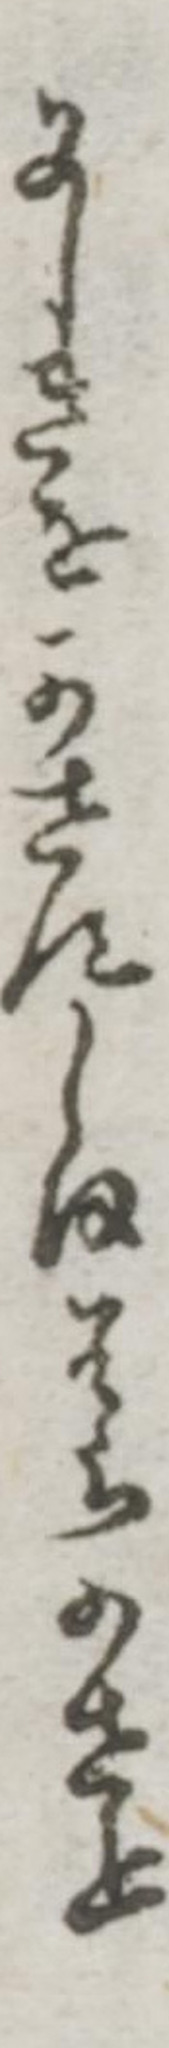にしきをかさるしほはらのさと
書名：塩原繁昌記　全
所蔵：東京大学地震研究所図書室 Earthquake Research Institute Library, The University of Tokyo, JAPAN
